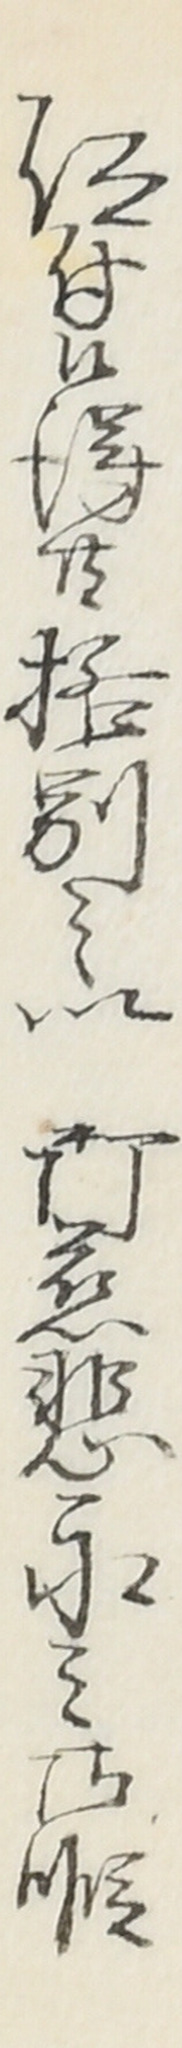仰付候得共格別之以御慈悲永之御暇
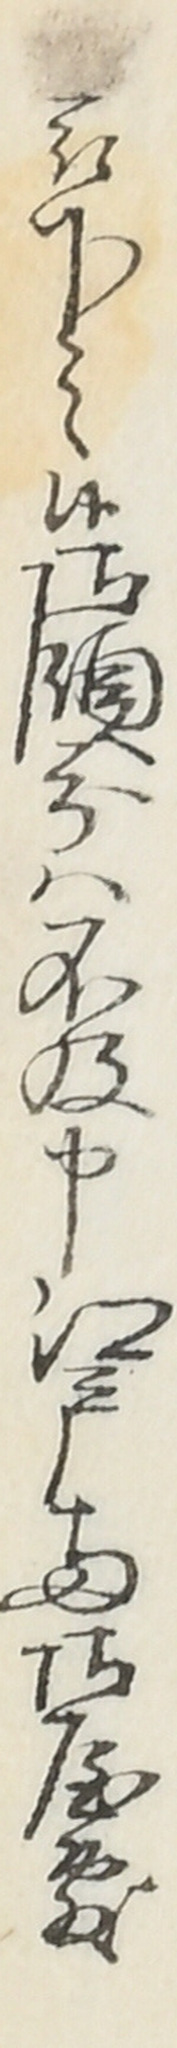被下之候御領分は不及申江戸両御屋敷
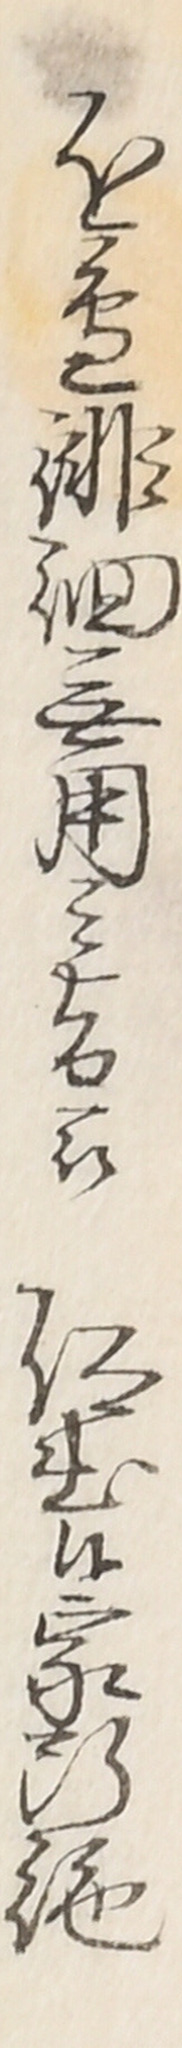近辺徘徊無用之旨被仰出候家断絶
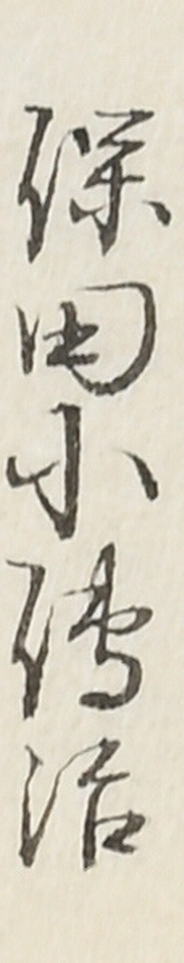保田小伝治
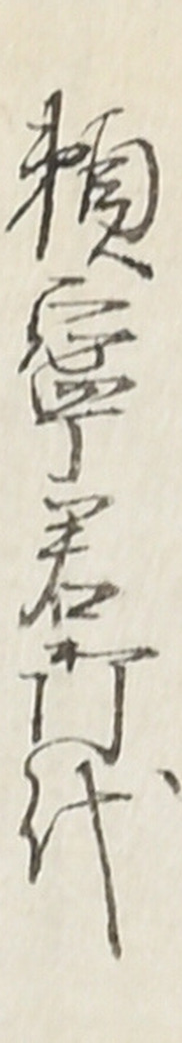頼寧君御代
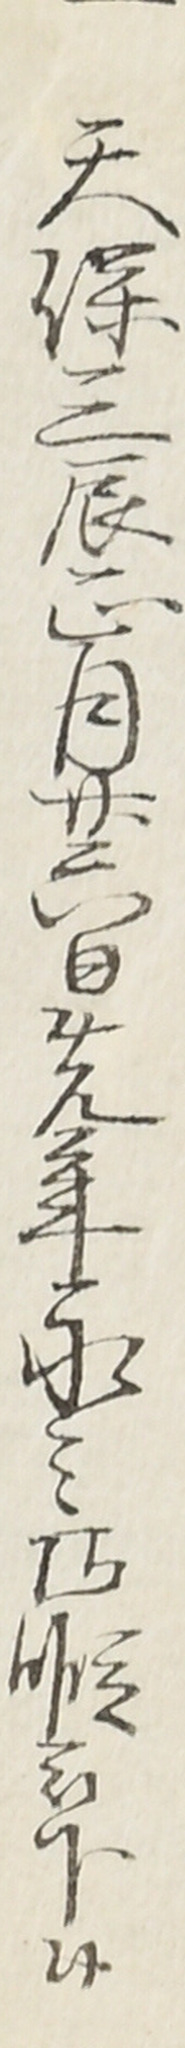一天保三辰正月廿六日先年永之御暇被下候
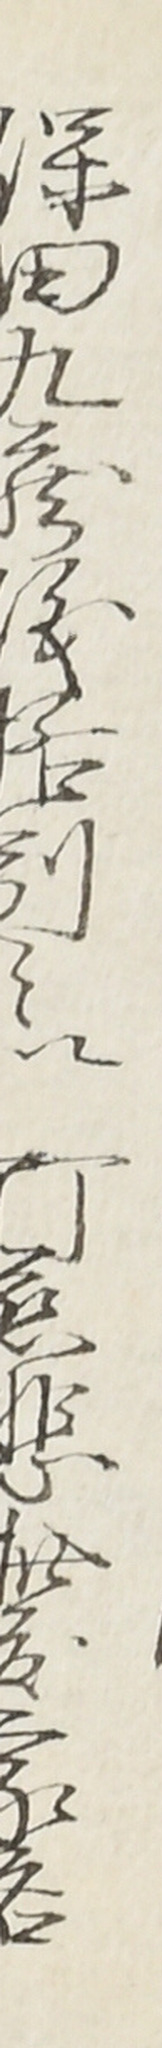保田九蔵儀格別之以御慈悲此度家名
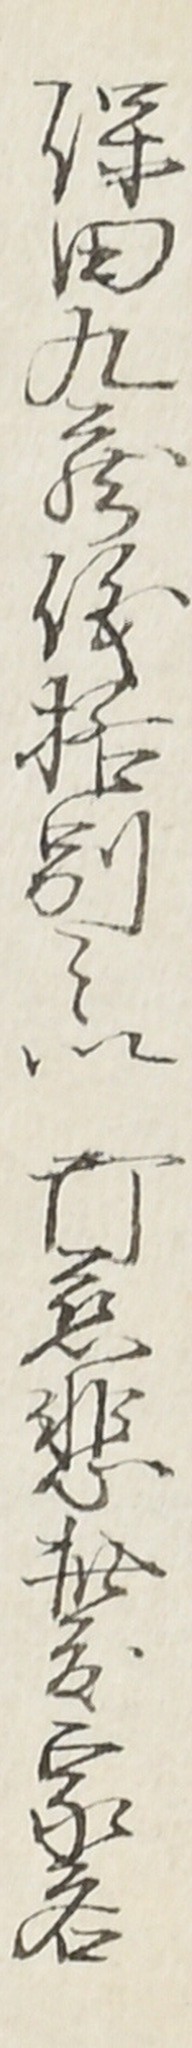保田九蔵儀格別之以御慈悲此度家名
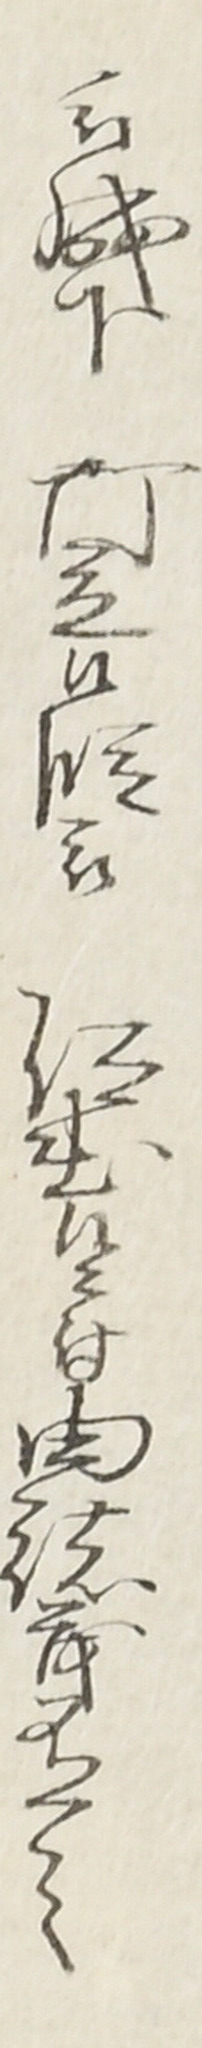被成下御立候段被仰出候ニ付由緒茂有之
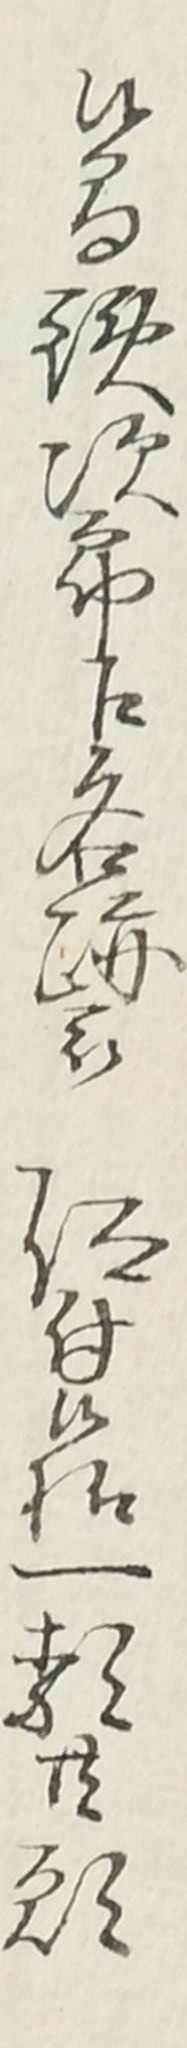候間鉄次郎江名跡被仰付候様一類共願
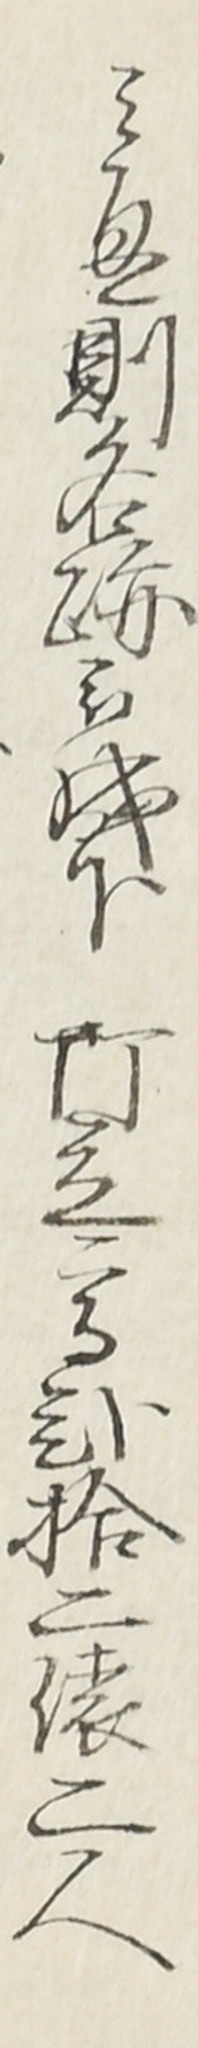之通則名跡被成下御立高弐拾二俵二人
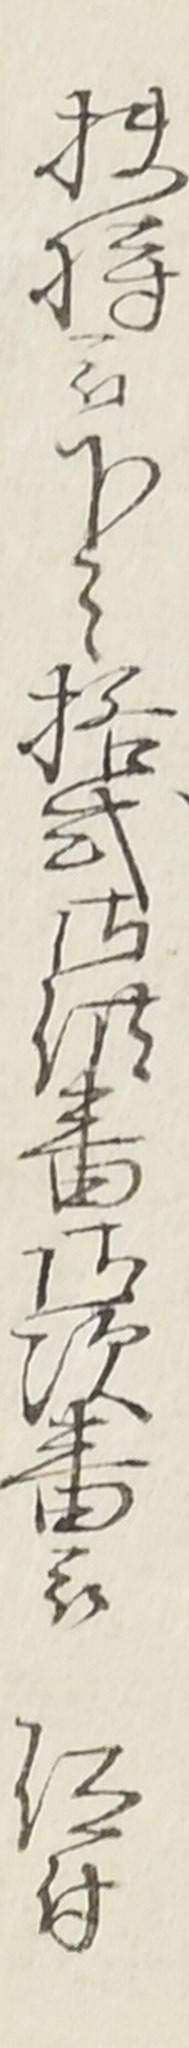扶持被下之格式御供番御次番被仰付
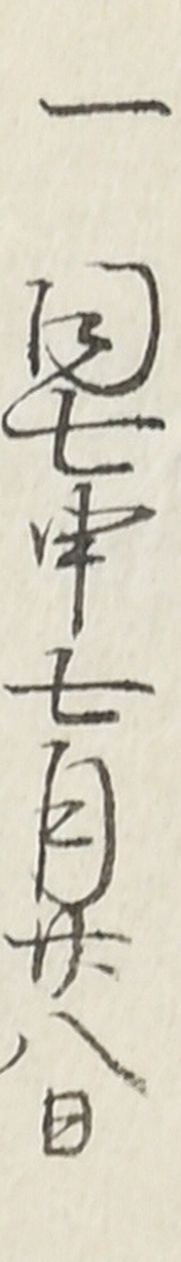一同七申七月廿八日
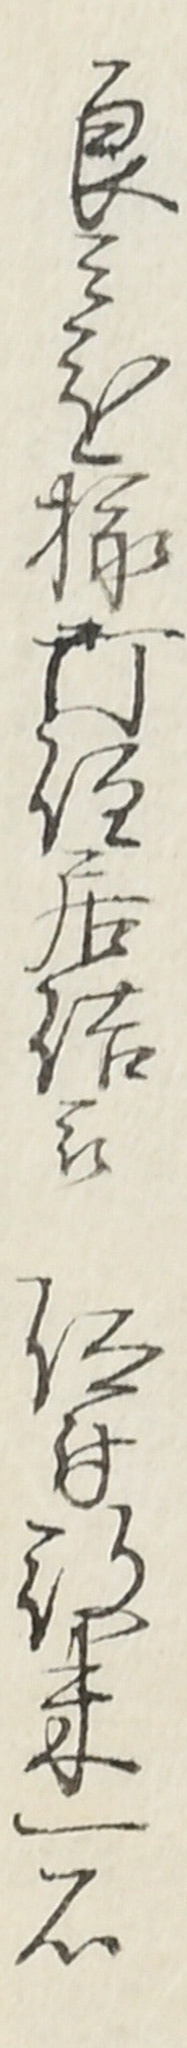良之進様御住居詰被仰付役米一石
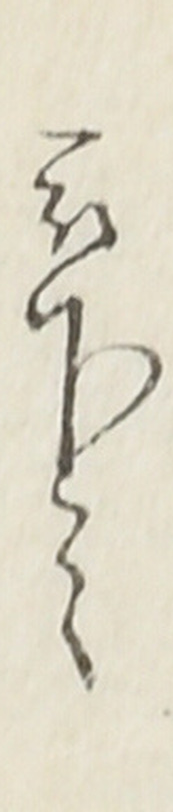被下之
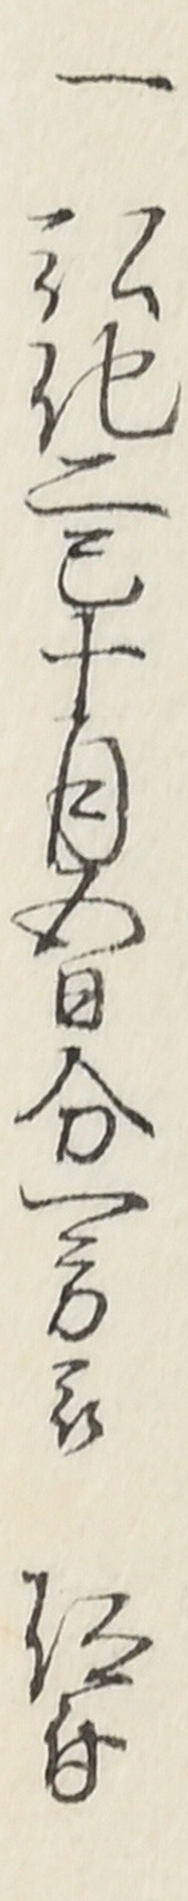一弘化二巳十月五日分一方被仰付
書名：給人諸士勤仕録（七）
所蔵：伊那市立高遠町図書館・合同会社AMANE
